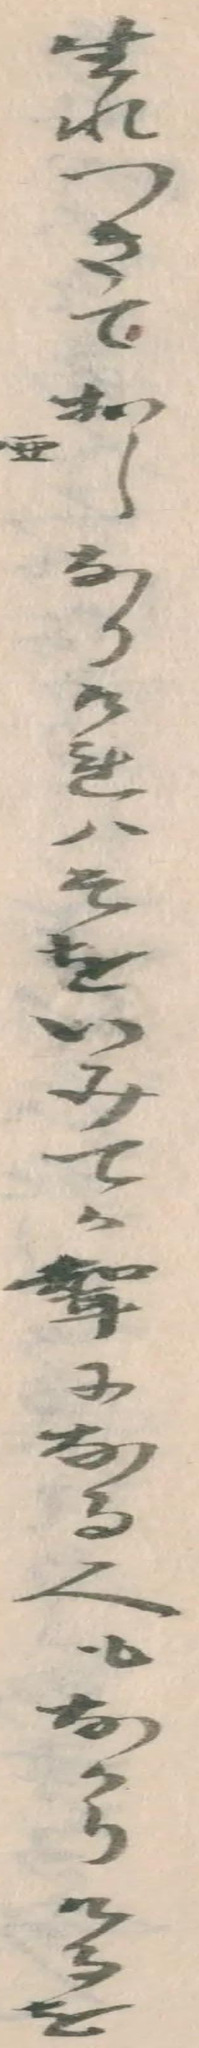生れつきておし唖なりけれはそをいみてか聟になる人もなかりけるを
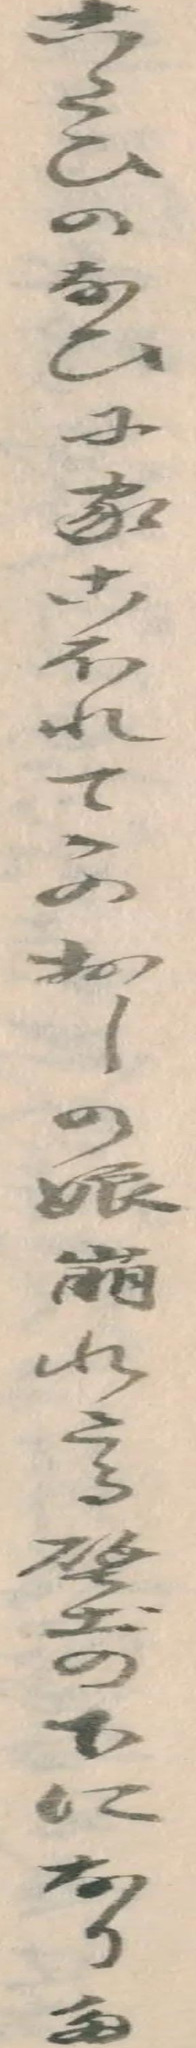こたひのなひに家こほれてかのおしの娘崩れたる壁土の下になりた

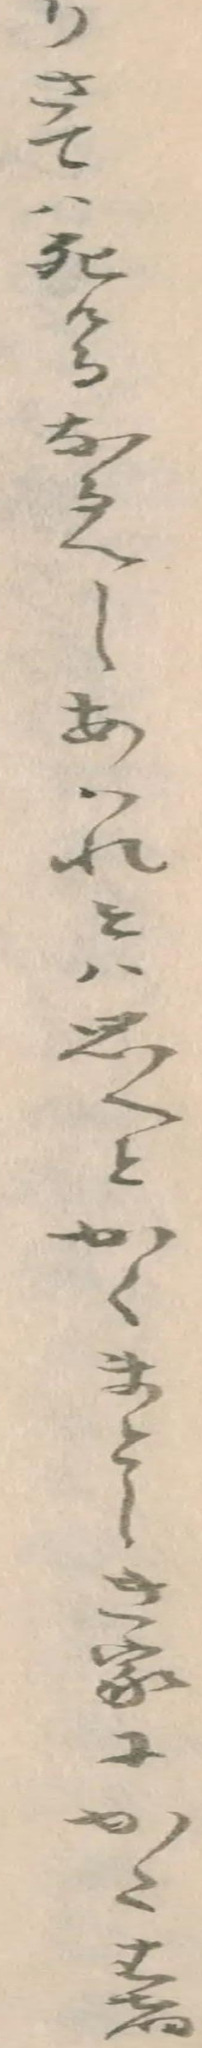りさては死けるなるへしあはれとは思へとかくまとしき家にかたは者
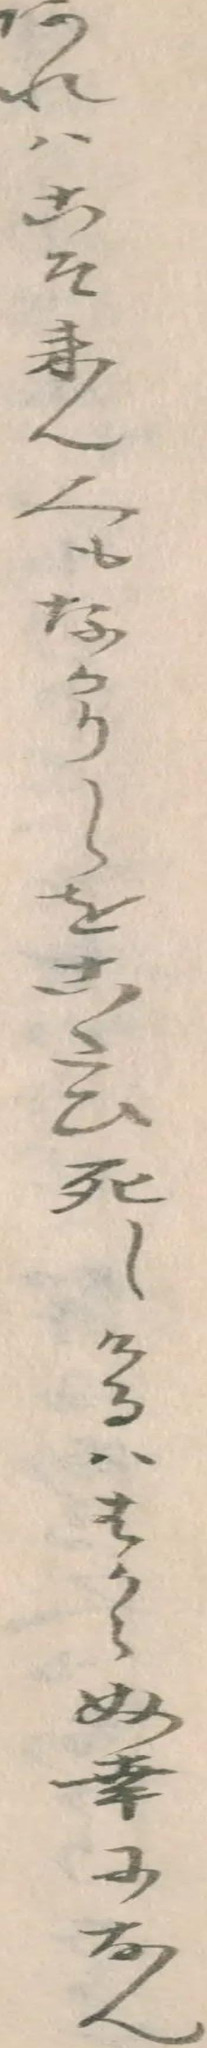あれはこそ来ん人もなかりしをこたひ死しけるははからぬ幸になん
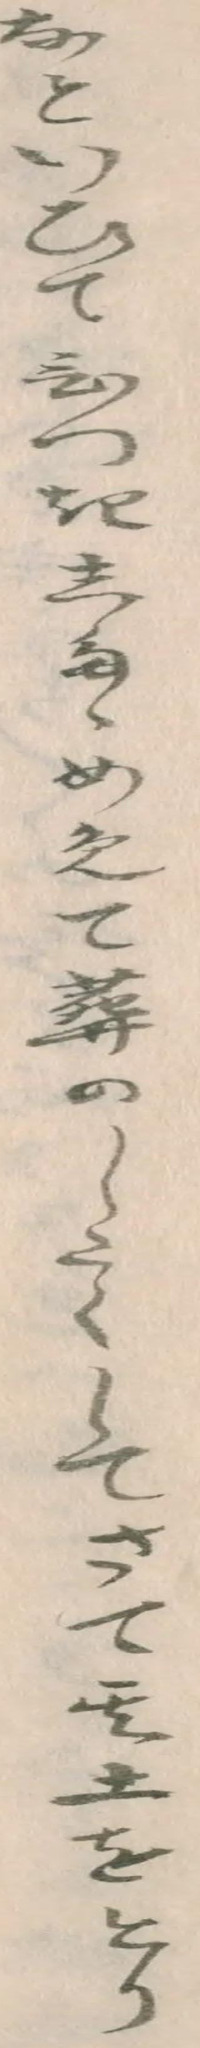なといひてひつきしたゝめめて葬のしたくしてさて其土をとり
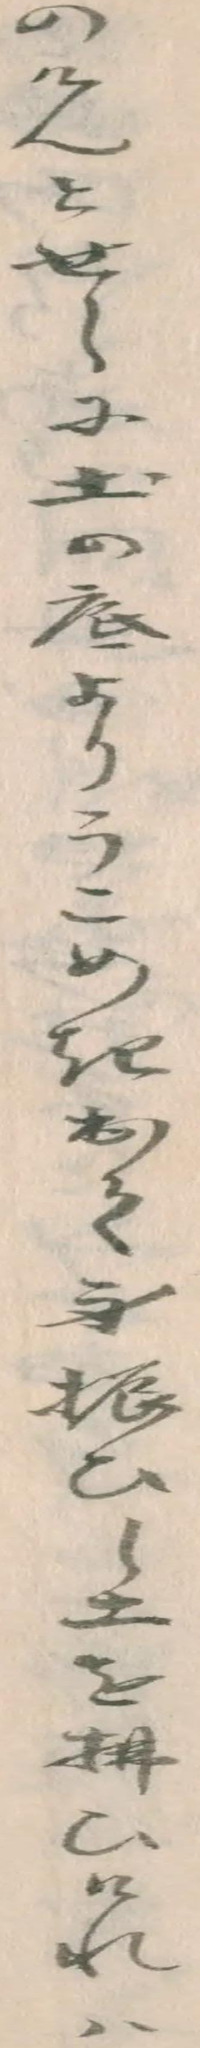のけんとせしに土の底よりうこめき出て身振ひし土を払ひけれは
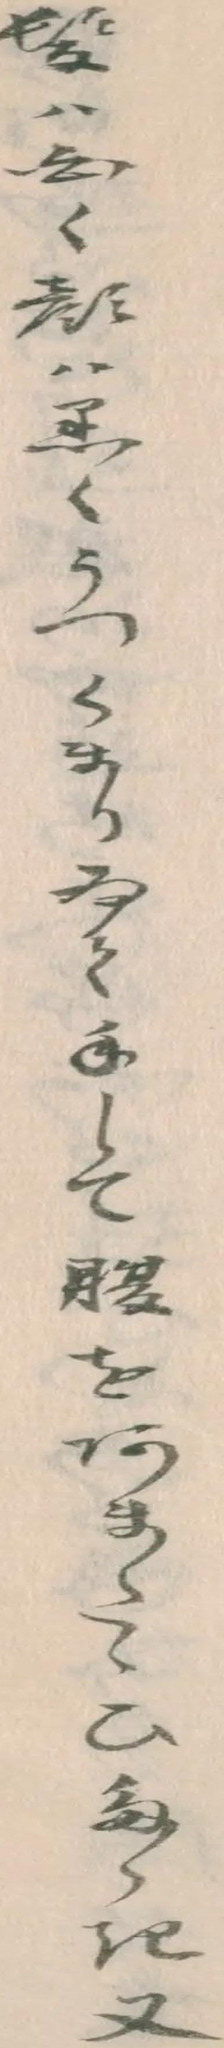髪は白く顔ハ黒くうつくまりゐて手して腹をあまたゝひたゝき又
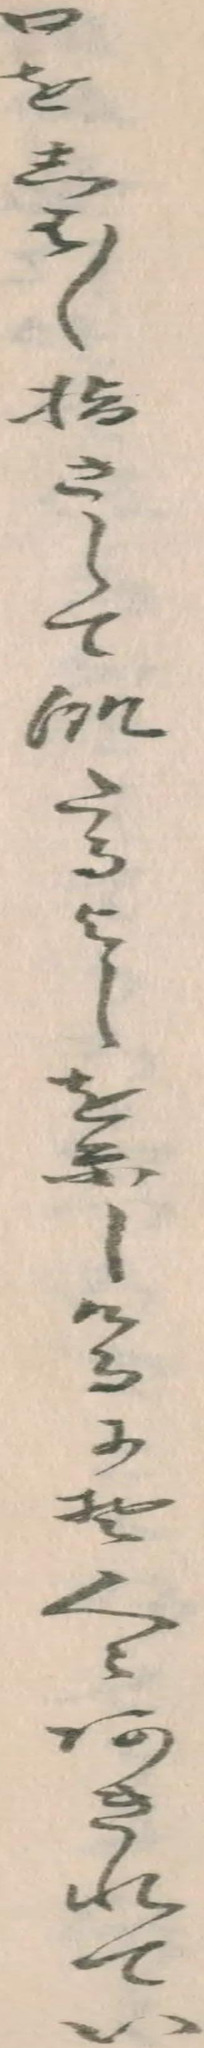口をしは〳〵指さして飢たるよしを示しけるにそ人々あきれてい
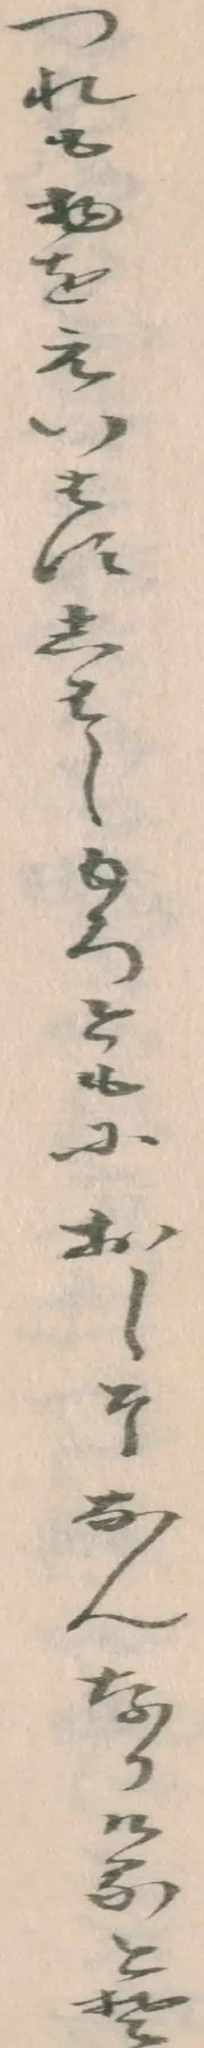つれも物をえいはすしはしもろともにおしになんなりけるとそ
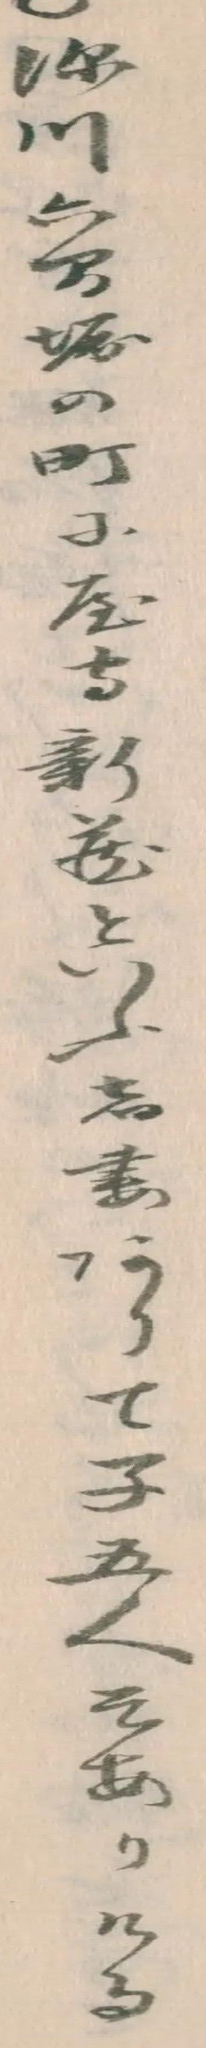○深川六間堀の町に屋守新蔵といふ者妻ありて子五人そありける
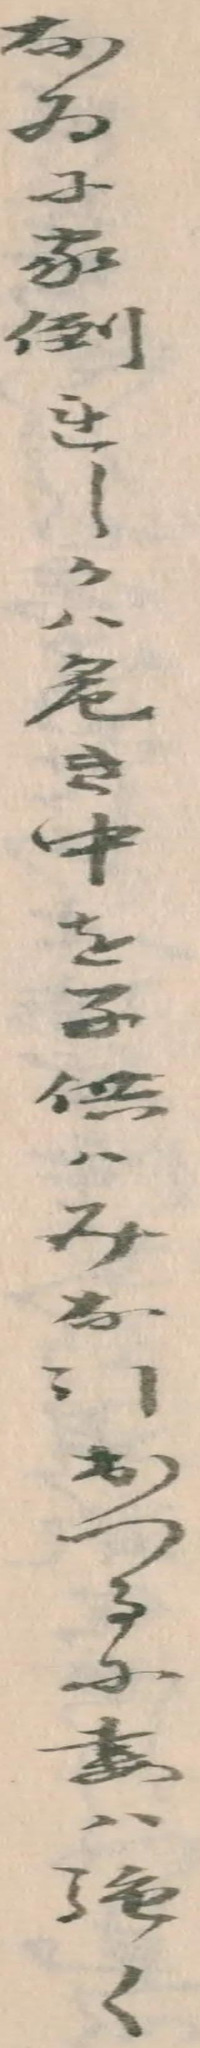なゐに家倒れしかは危き中を子供はみな引出つるに妻は強く
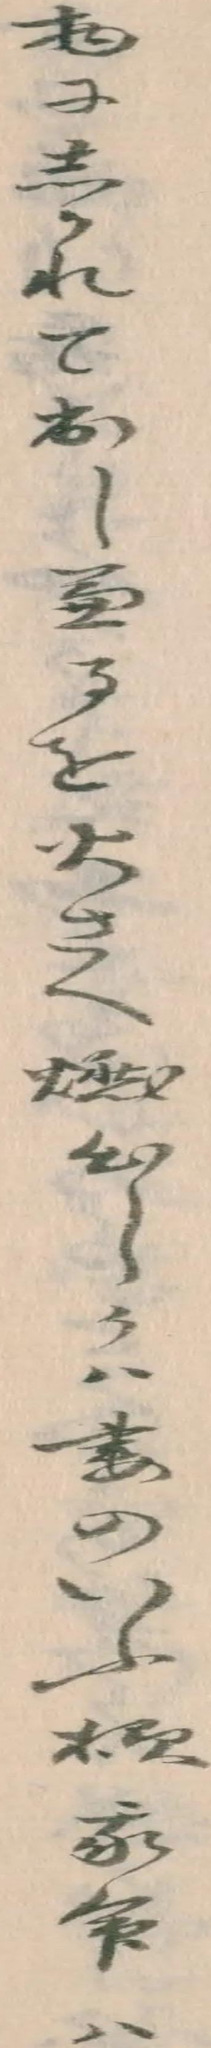物にしかれて出し兼るを火さへ燃出しかは妻のいふ様我命は
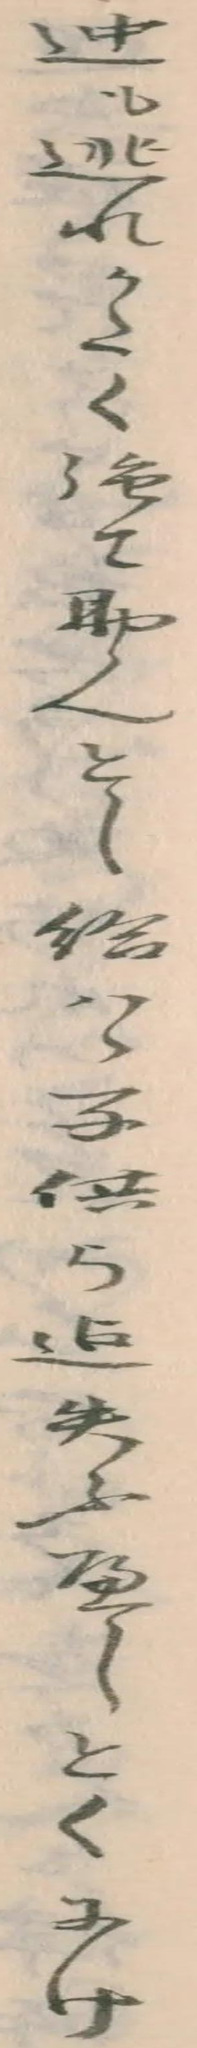迚も逃れかたく強て助んとし給はゝ子供ら迄失ふへしとくにけ
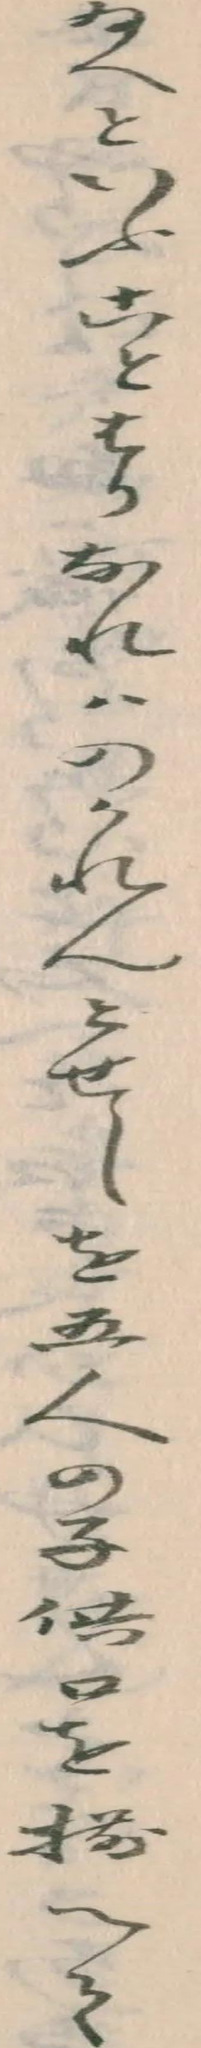給へといふことはりなれはのかれんとせしを五人の子供口を揃へて
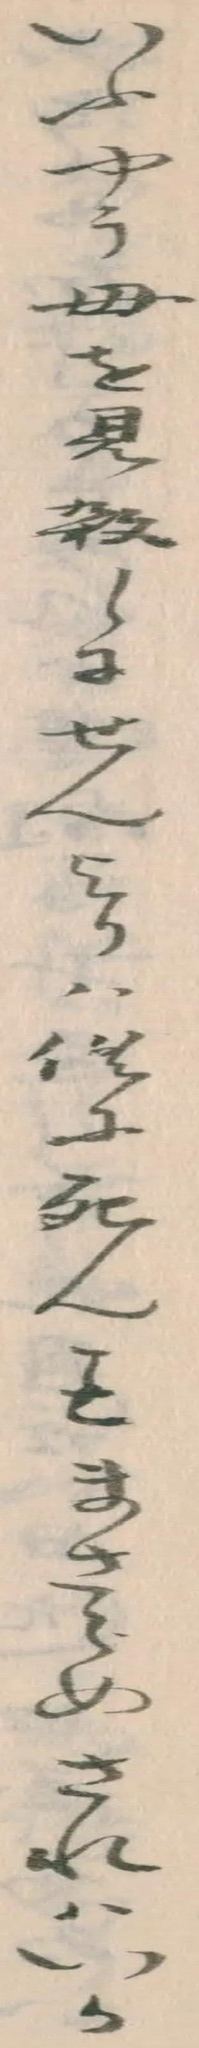いふやう母を見殺しにせんよりは倶に死んことまさらめされはいか
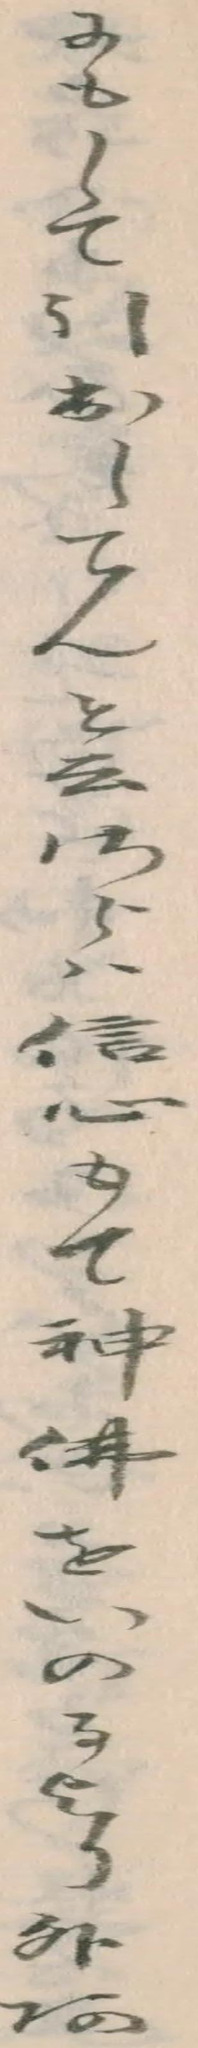にもして引出してんと言さらは信心もて神仏をいのるより外あ
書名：地災撮要. 巻10(地震之部) 上,下
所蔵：国立国会図書館 National Diet Library, JAPAN
